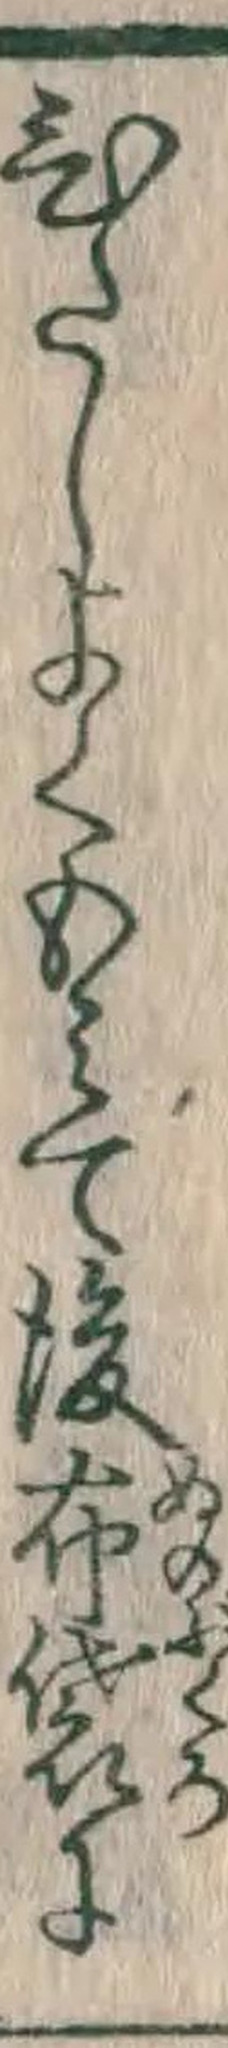ひたしよくもみて後布袋に
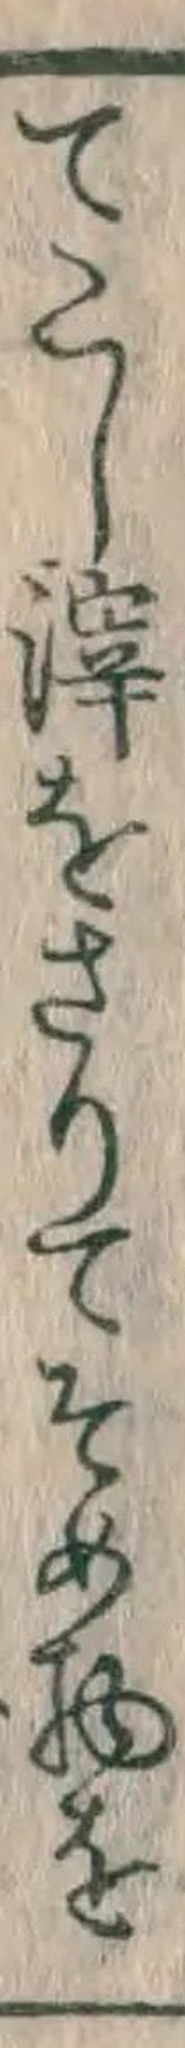てこし滓をさりてそめ物を
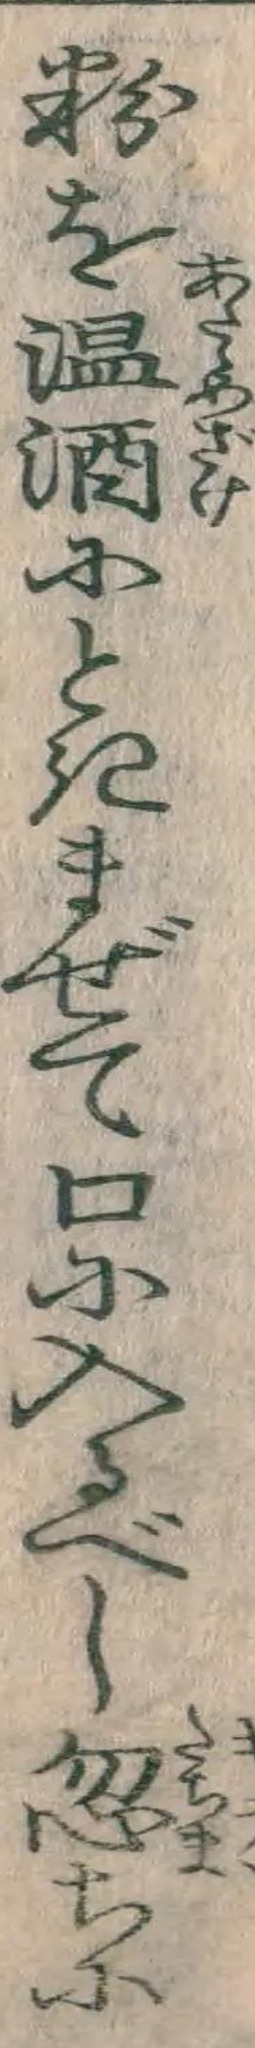粉を温酒にときまぜて口に入るべし忽ちに
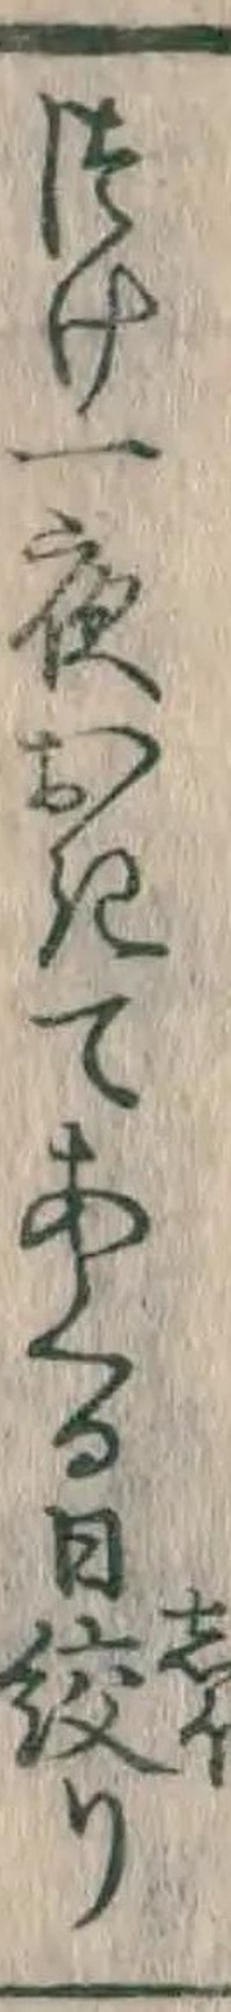つけ一夜おきてあくる日絞り
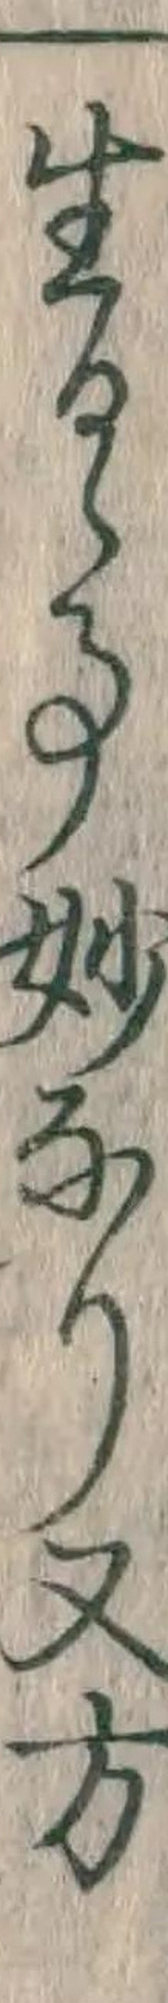生るゝ事妙なり又方
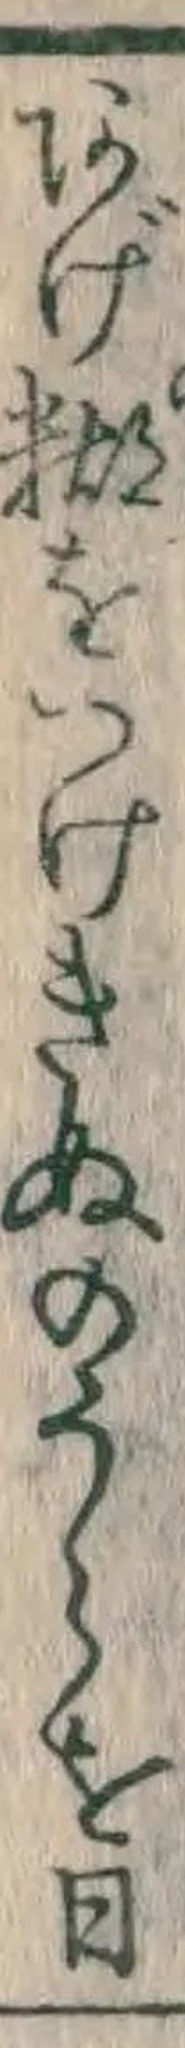あげ糊をつけきぬのうらを日
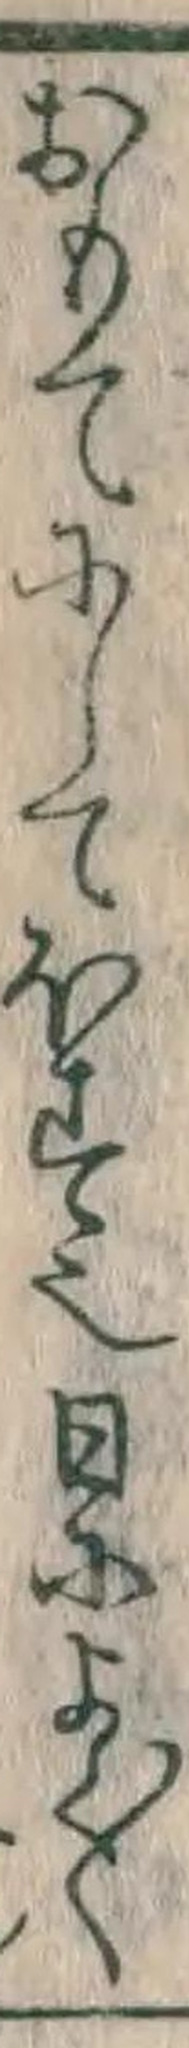おもてにしてほす也日によく〳〵
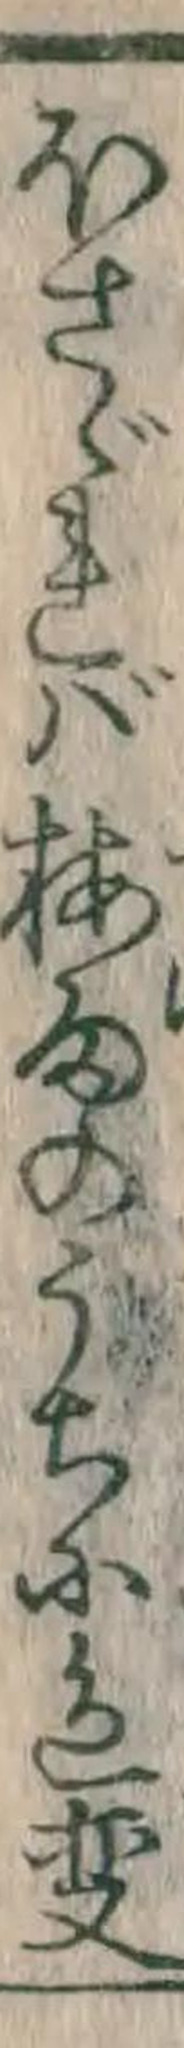ほさゞれば梅雨のうちに色変
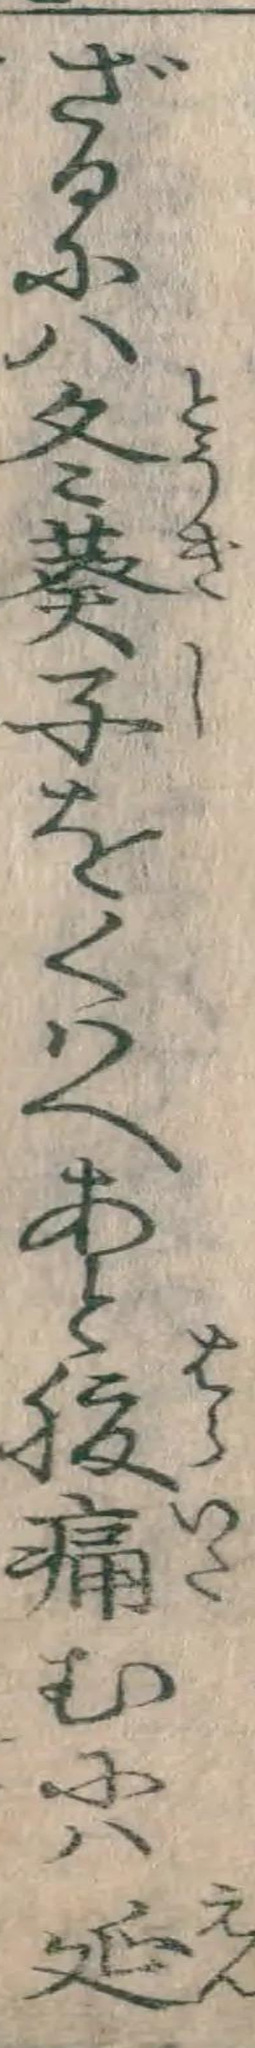ざるには冬葵子をくはへあと腹痛むには延
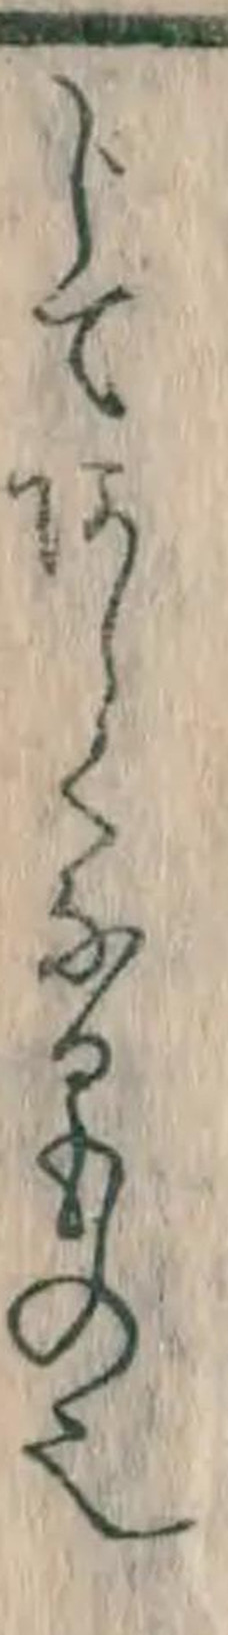じてあしくなるもの也
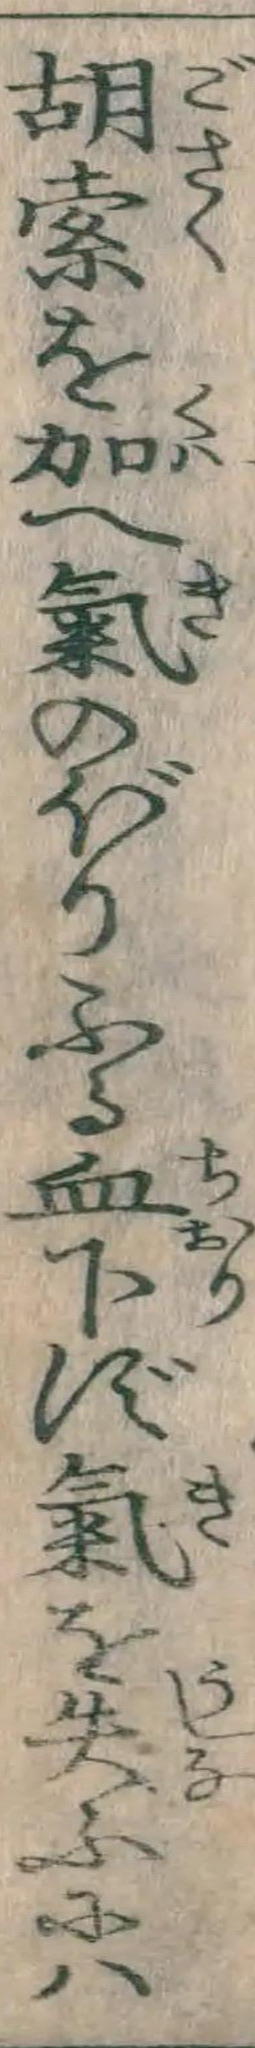胡索を加へ気のぼりふる血下ず気を失ふには

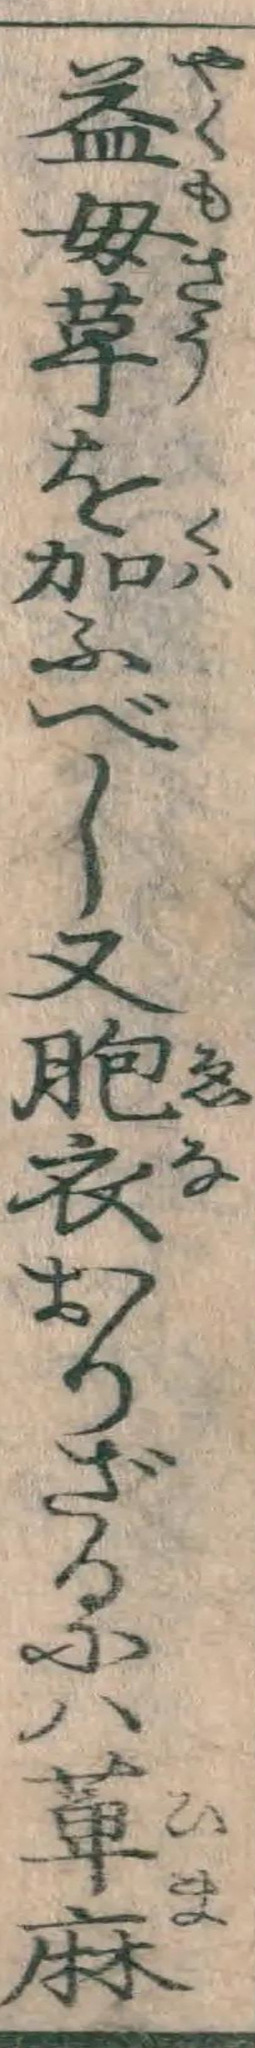益母草を加ふべし又胞衣おりざるには萆麻
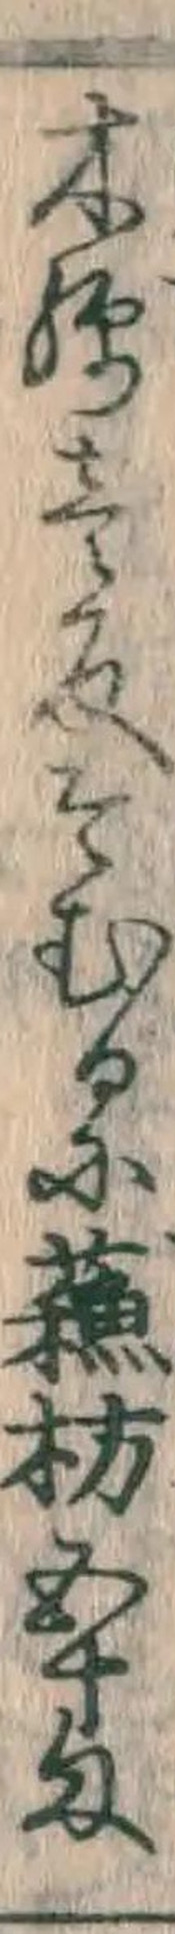木綿壱反そむるに蘓枋五十匁
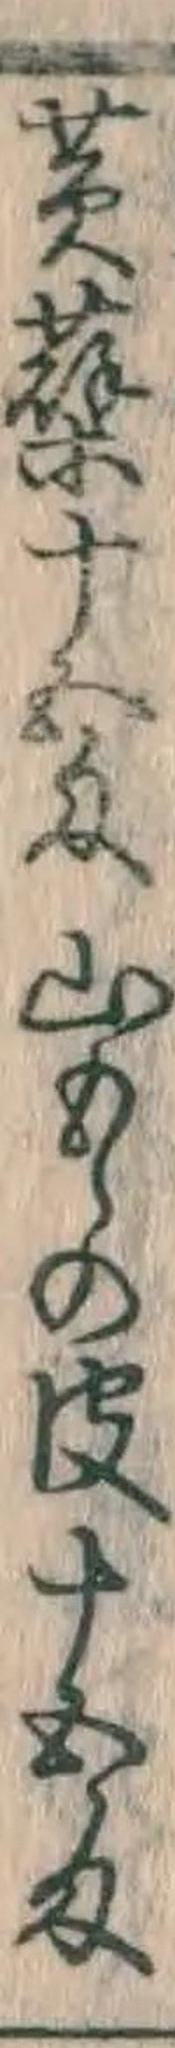黄蘗十五匁山もゝの皮十五匁
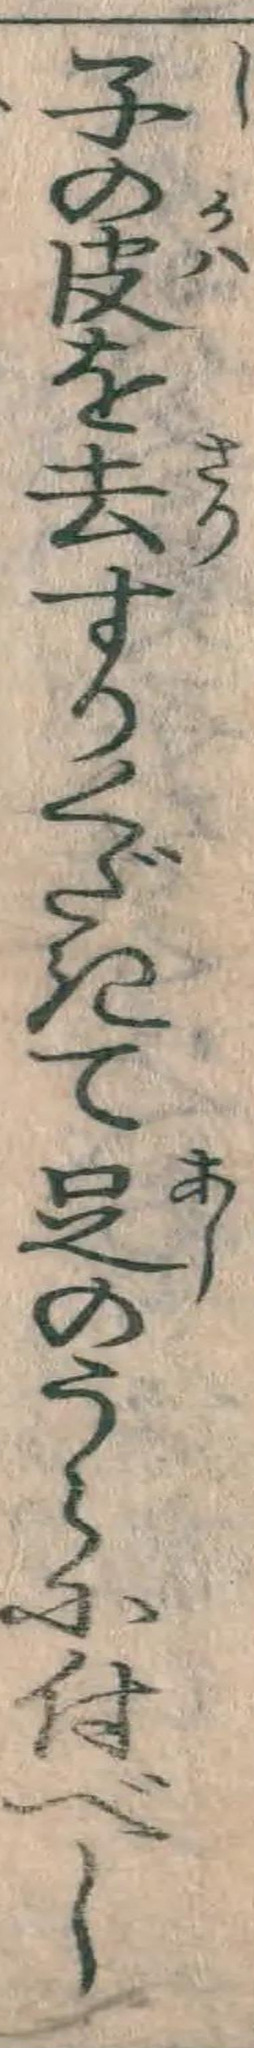子の皮を去すりくだきて足のうらに付べし
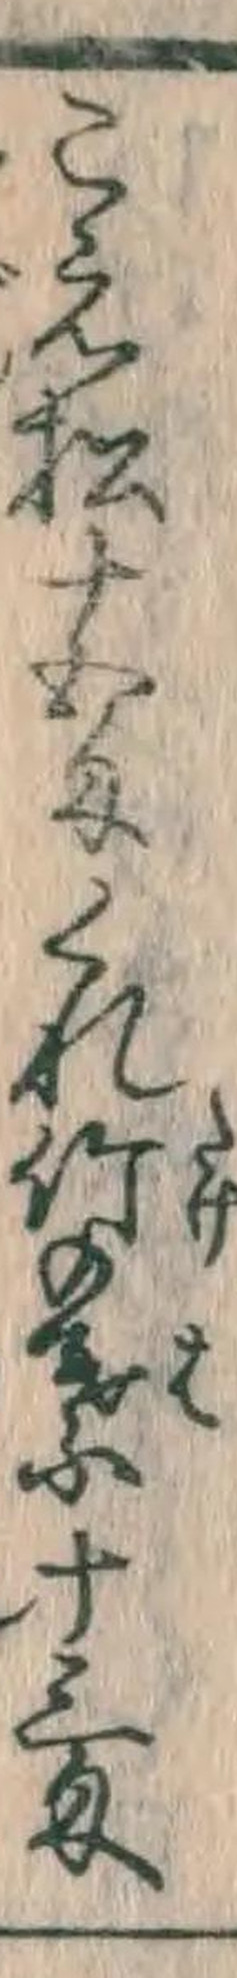こえ松十五匁くれ竹の葉十三匁
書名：広益秘事大全 3巻. [3]
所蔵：国立国会図書館 National Diet Library, JAPAN
